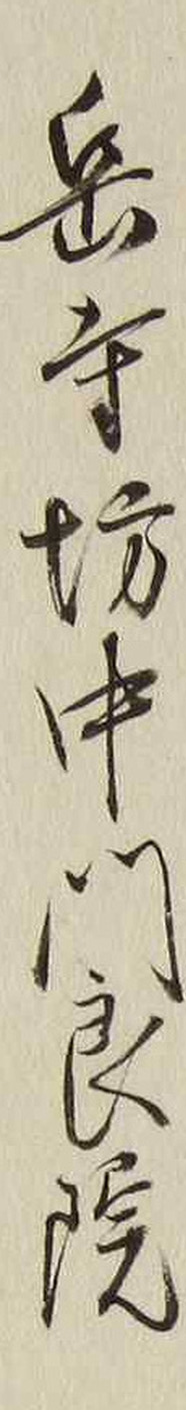岳寺坊中門良院
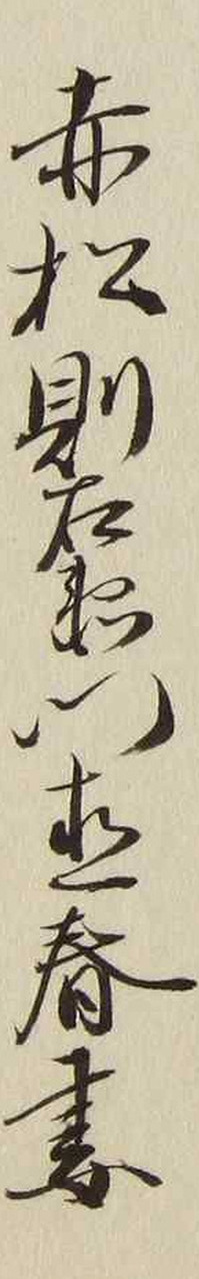女赤松則右衛門直春妻

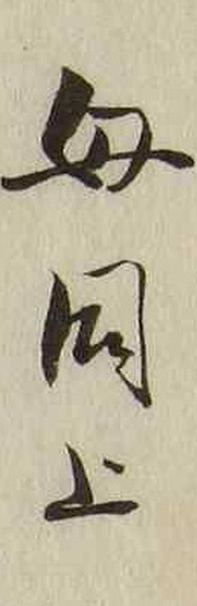母同上
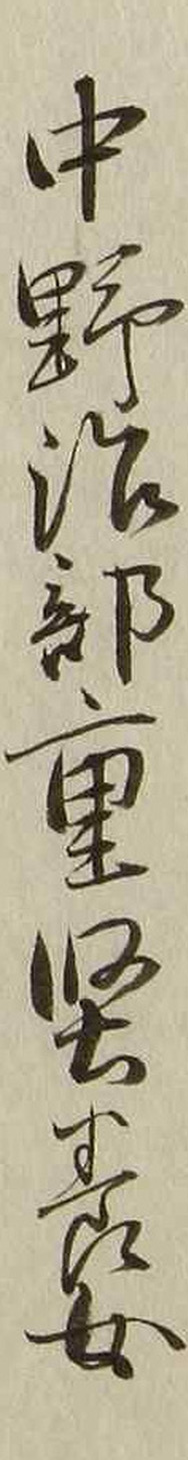女中野治部重堅養女
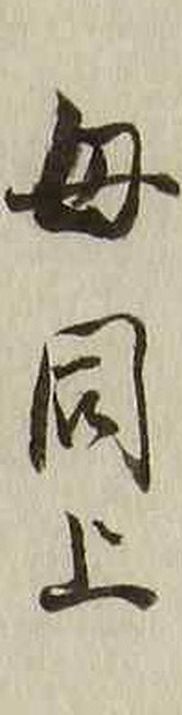母同上
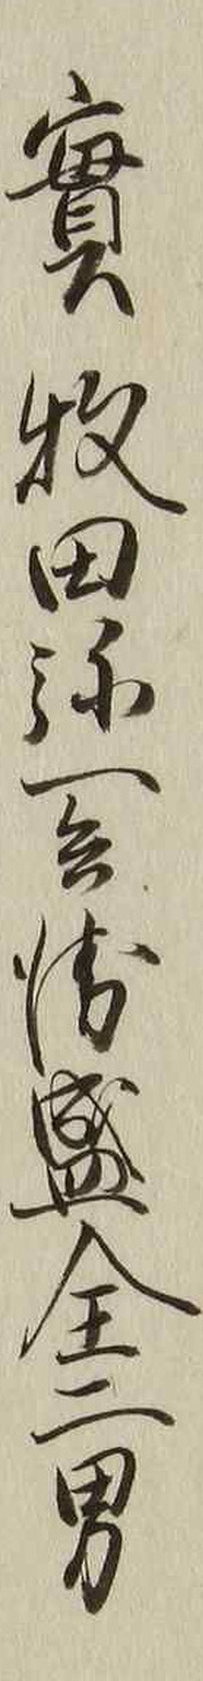実牧田弥一兵衛盛全二男
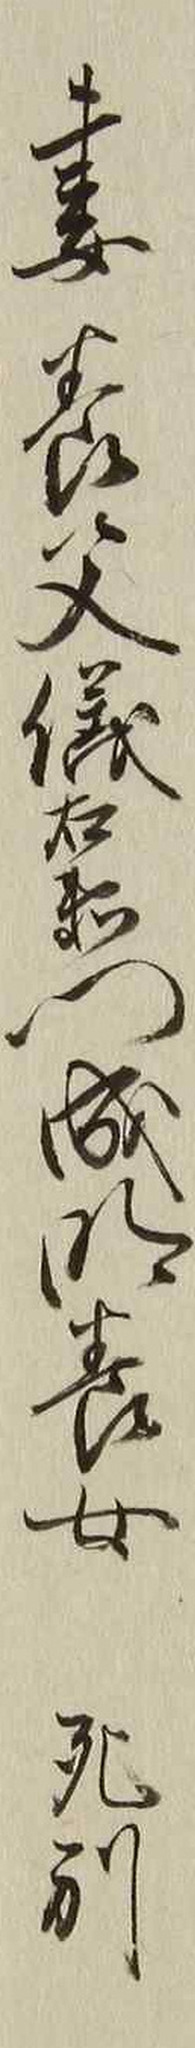妻養父儀右衛門成明養女死別
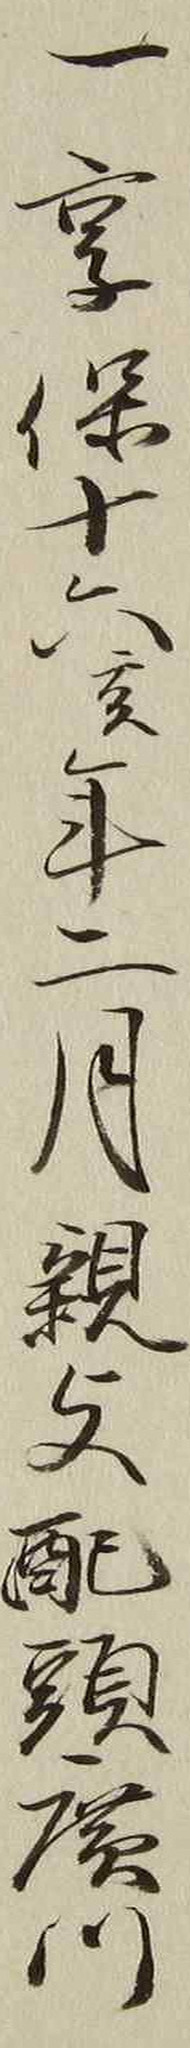一享保十六亥年二月親支配頭広川
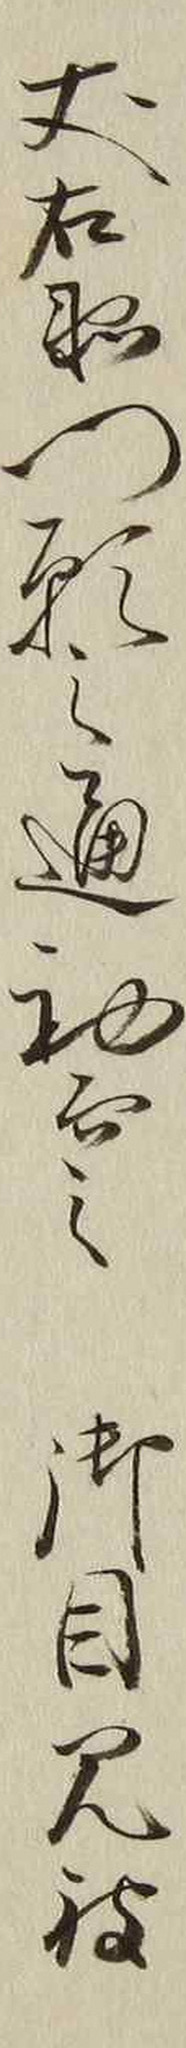丈右衛門願之通初而之御目見被
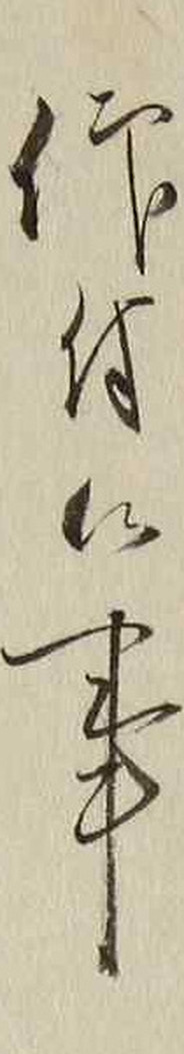仰付候事
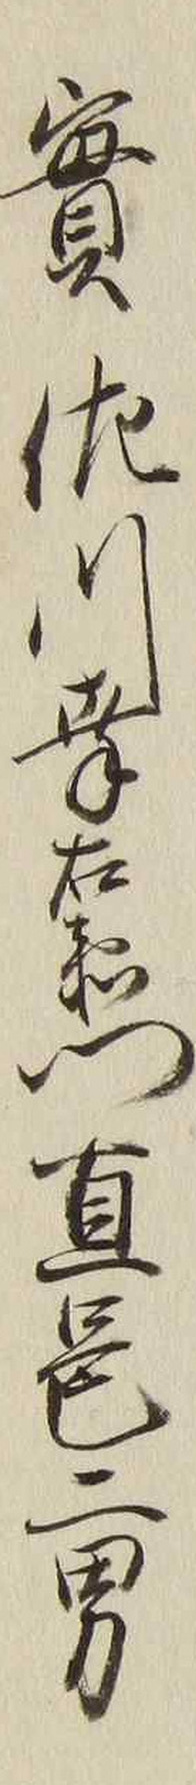実佐川幸右衛門直邑二男

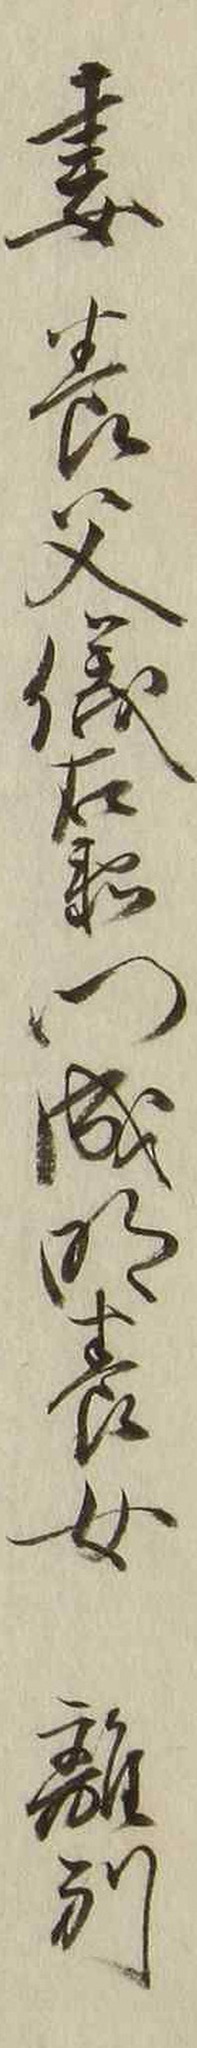妻養父儀右衛門成明養女離別
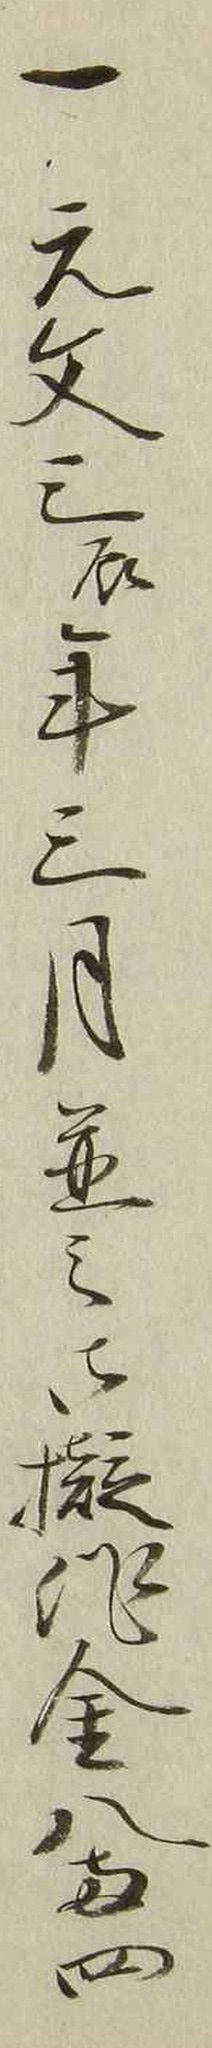一元文三辰年三月並之御擬作金八両四
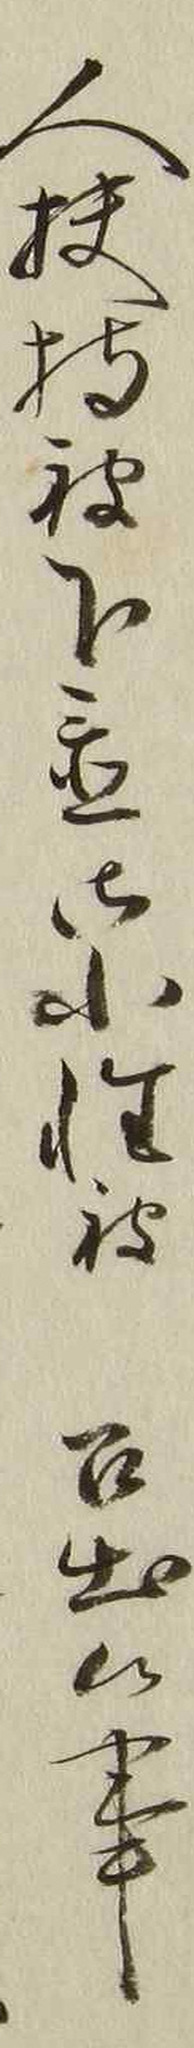人扶持被下置御小性被召出候事
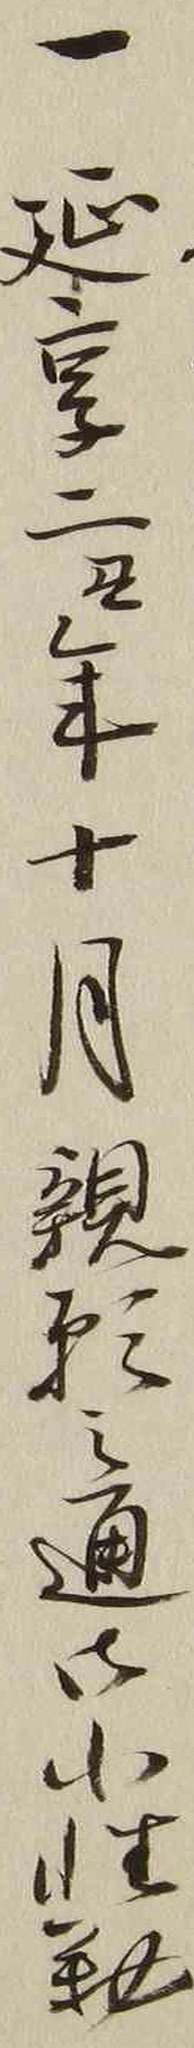一延享ニ丑年十月親願之通御小性勤
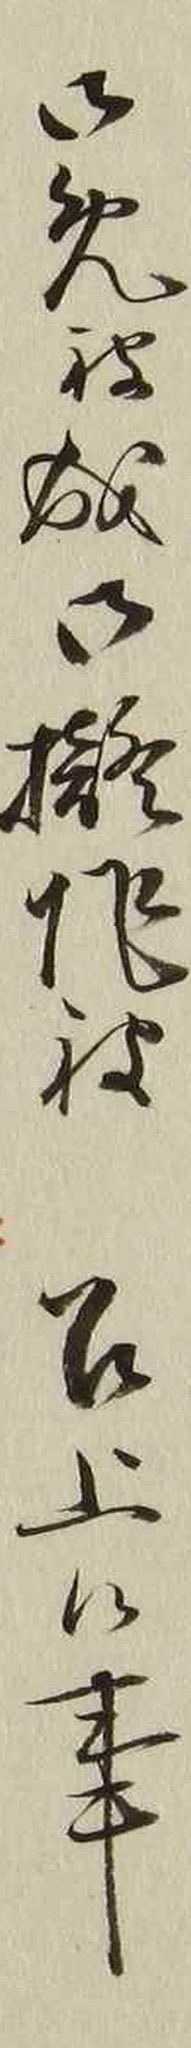御免被成御擬作被召上候事
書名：諸士系譜　巻之163　な之部5
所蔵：会津若松市立会津図書館
